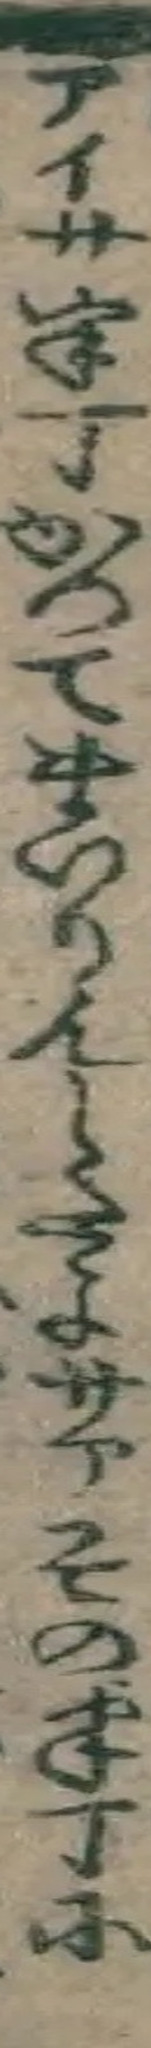アイサ半丁かつてまいりんしたにサアその半丁に
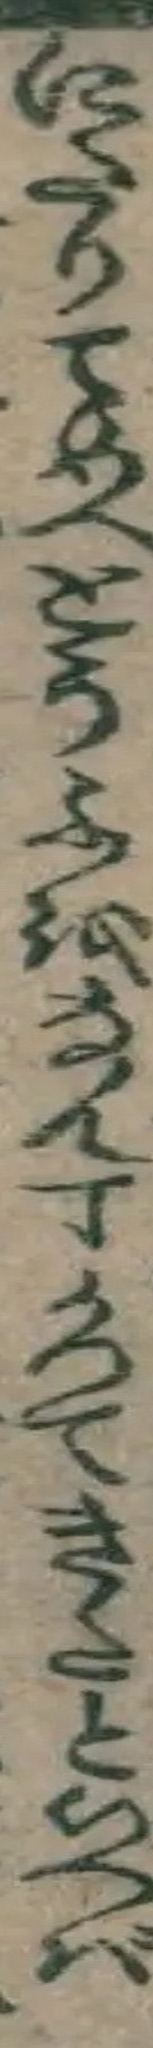にたりてめへとうふをなん丁かつてきたといへば
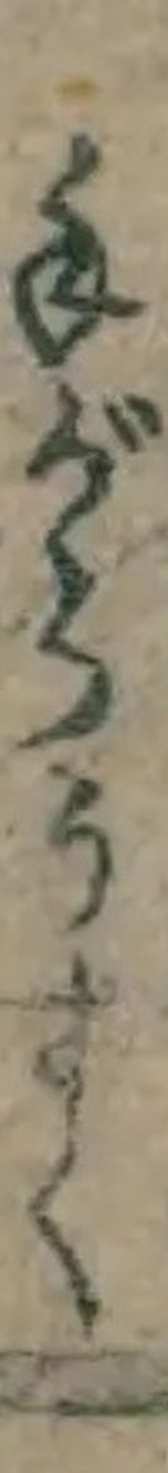手がらうすく
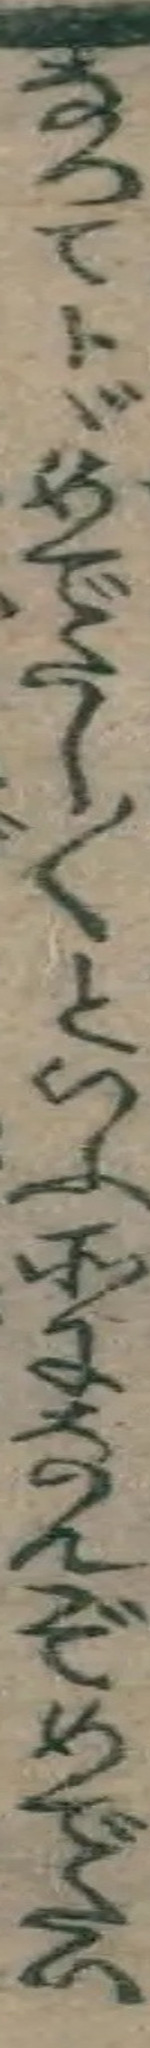なつてトヾめでたし〳〵といふ所になんぞめでたい
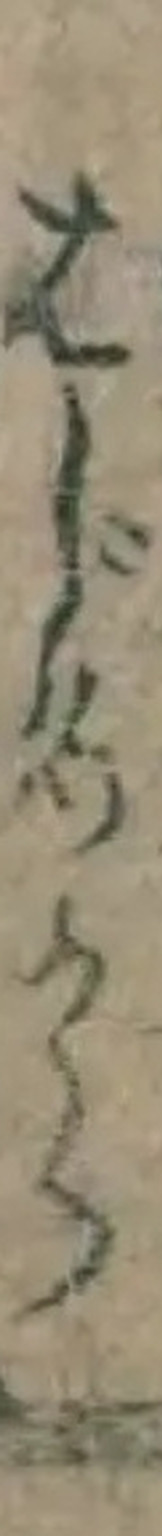はじめから
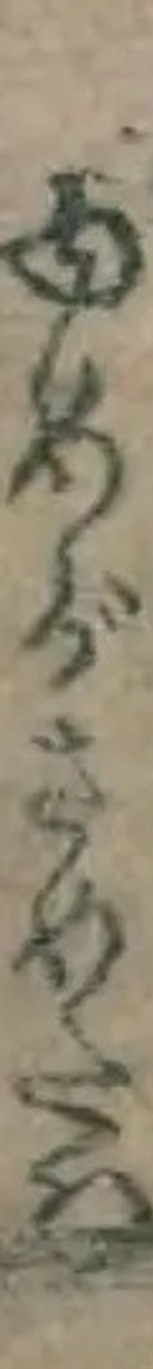ゆめがさめたは
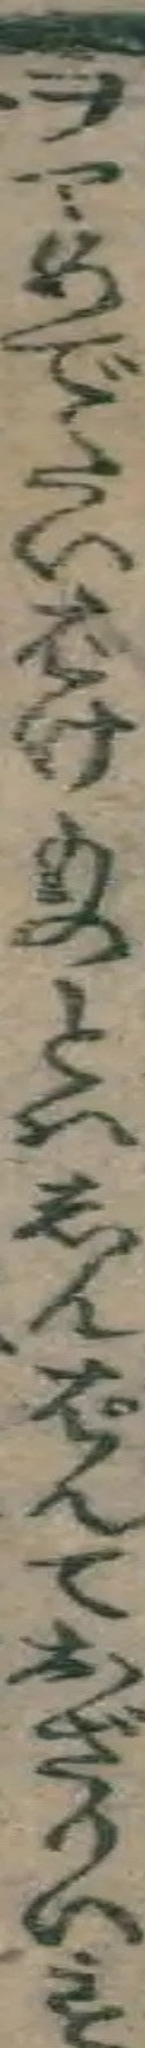ヲアめでたいばけものとはしんぱんておざりいす
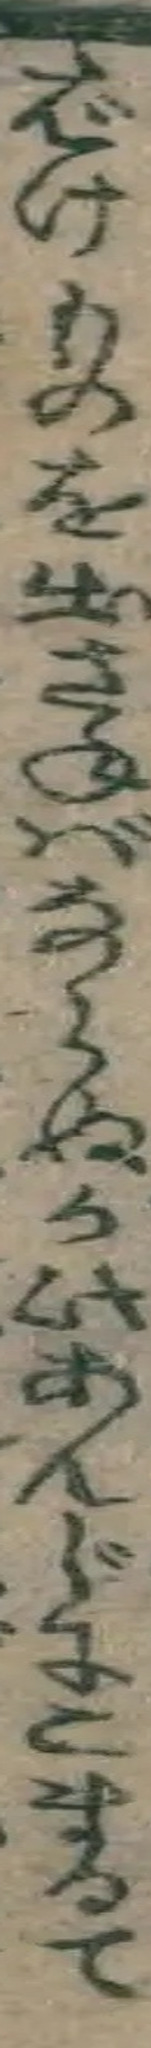ばけものを出さねばならぬか此あんじにこまるて
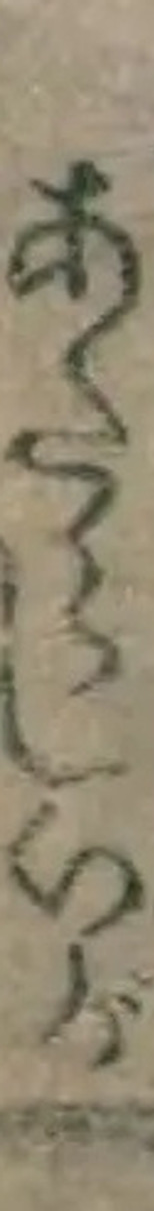あたらしいが
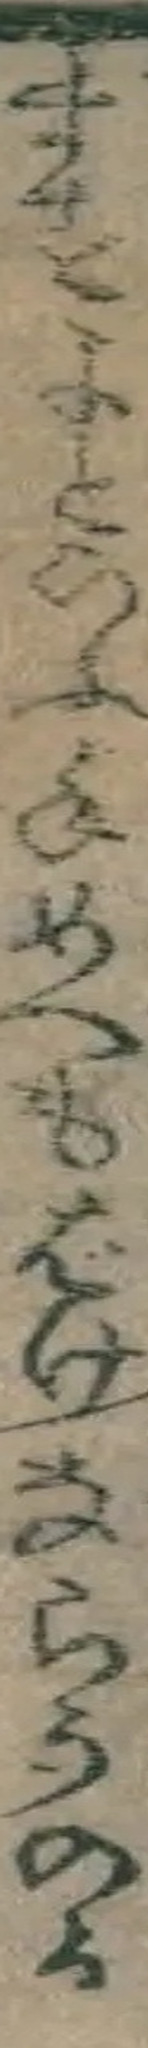ますよといふ手めへもばけならうのか
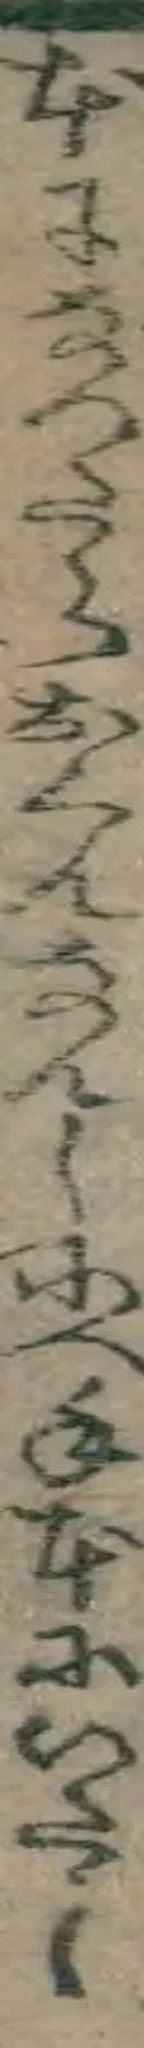本になつたらおくんなんしにへ手本にいたし
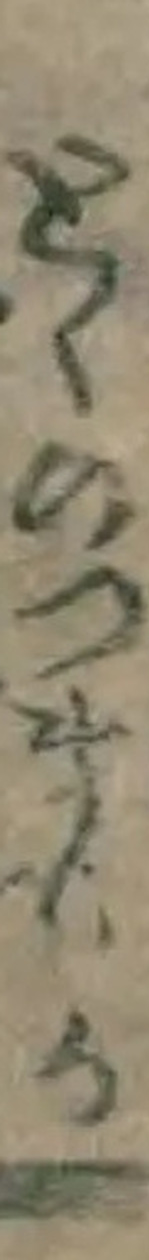とゝのつまりか
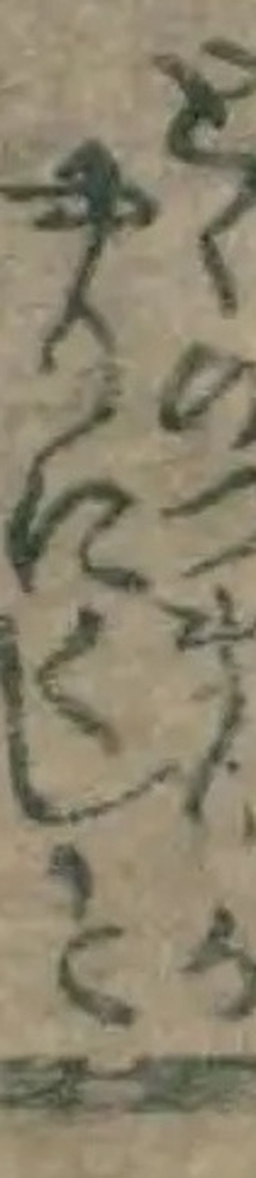やりにくしと
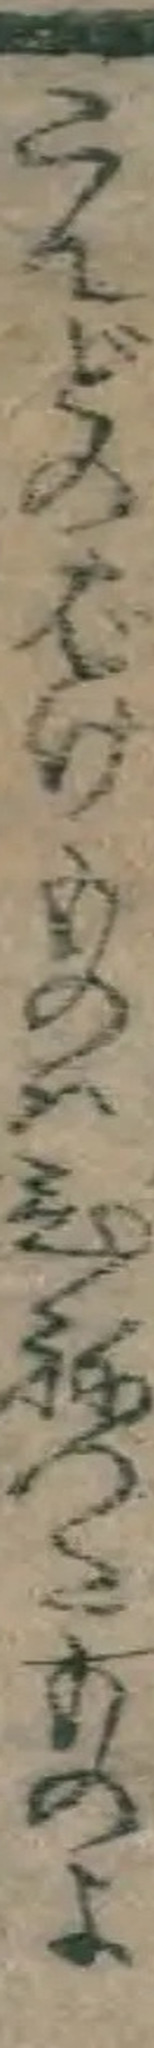こんどのばけものはひねつたものに
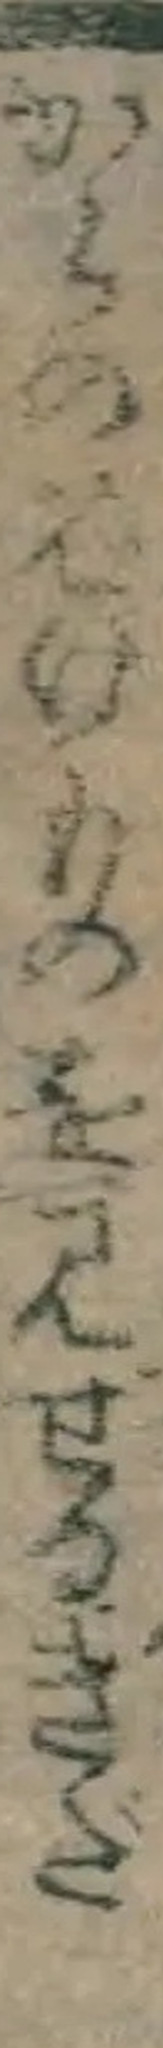からのばけものを見せるきだ
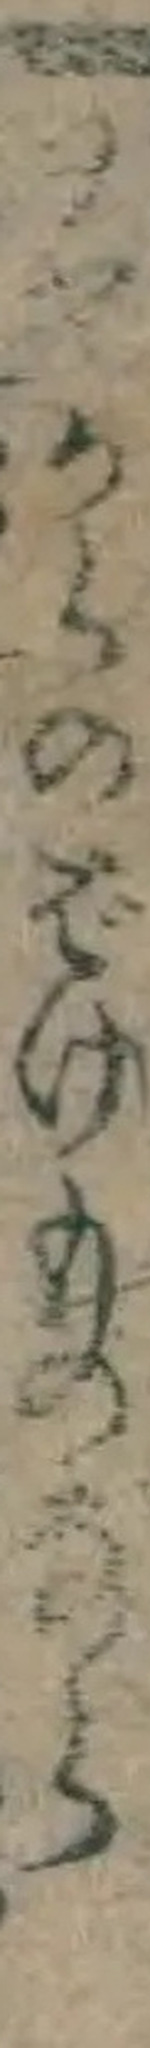ヲヤからのばけものなら
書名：大時代唐土化物 3巻
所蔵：国立国会図書館 National Diet Library, JAPAN
